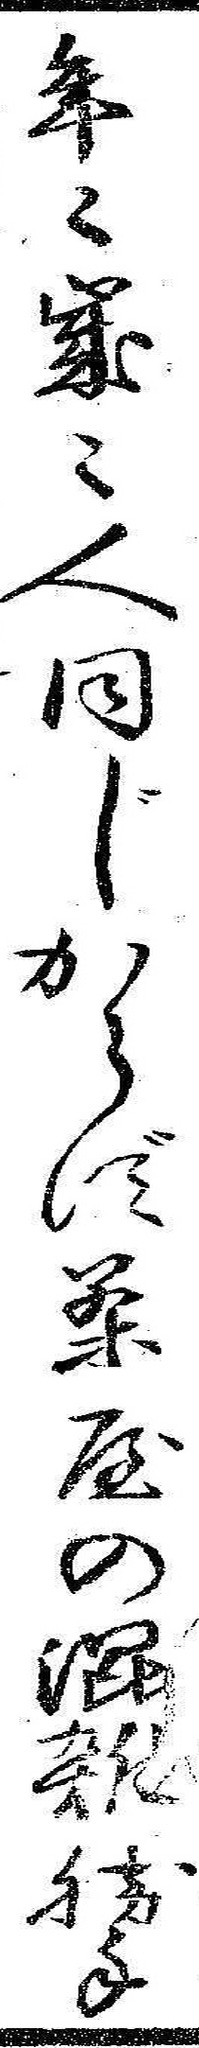年々歳々人同じからず茶屋の混雑勝手
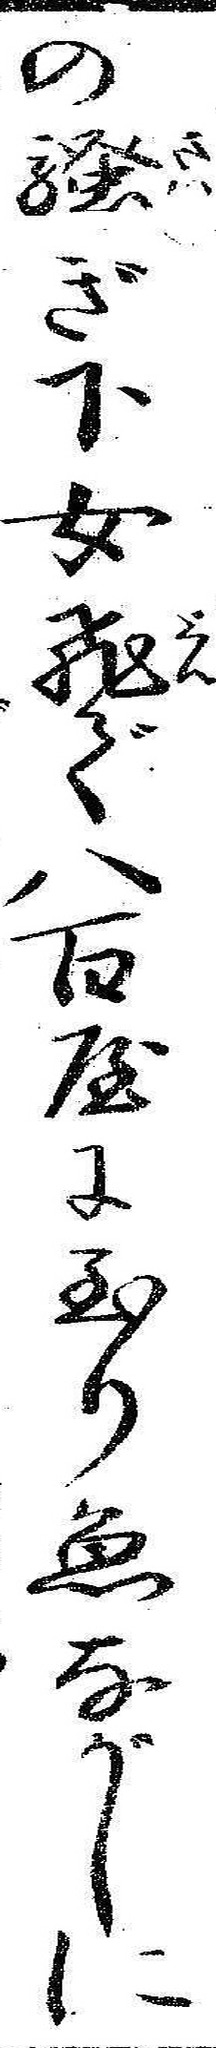の騒ぎ下女飛で八百屋に至り魚ながしに
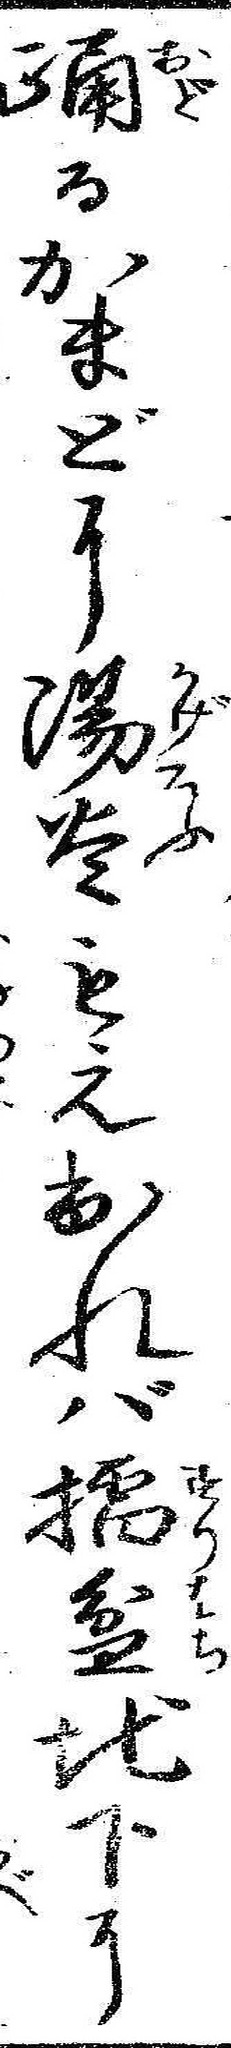踊るかまどに陽炎もえ出れば擂盆地下に
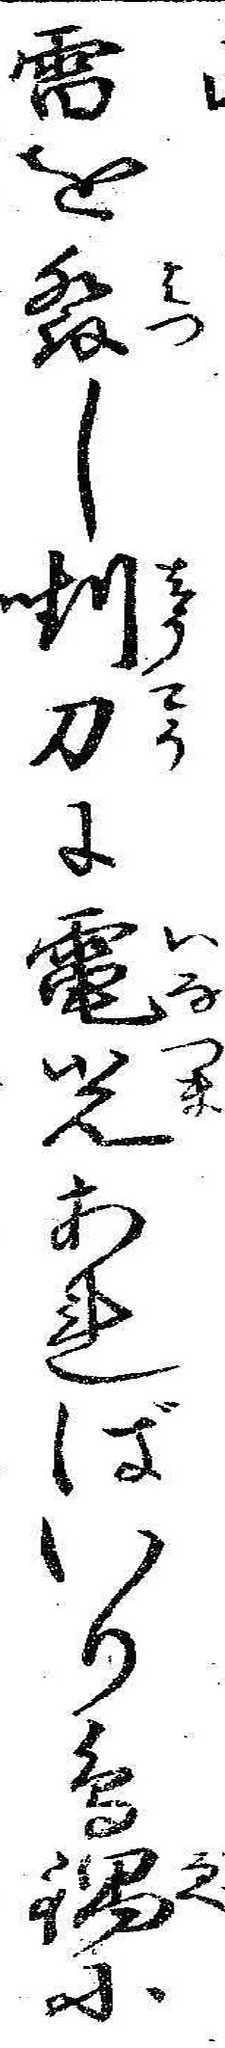雷を発し剉刀に電光あればいり鳥鍋に
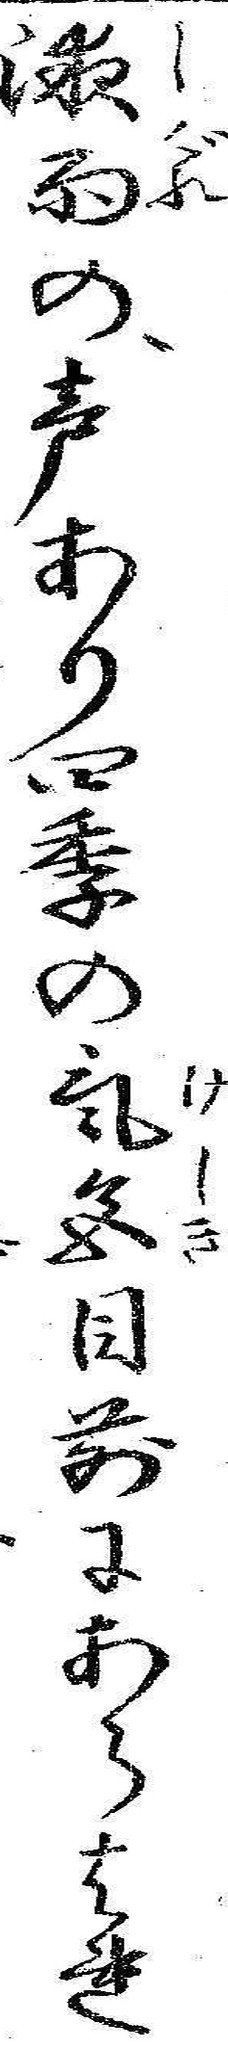液雨の声あり四季の気色目前にあらはれ
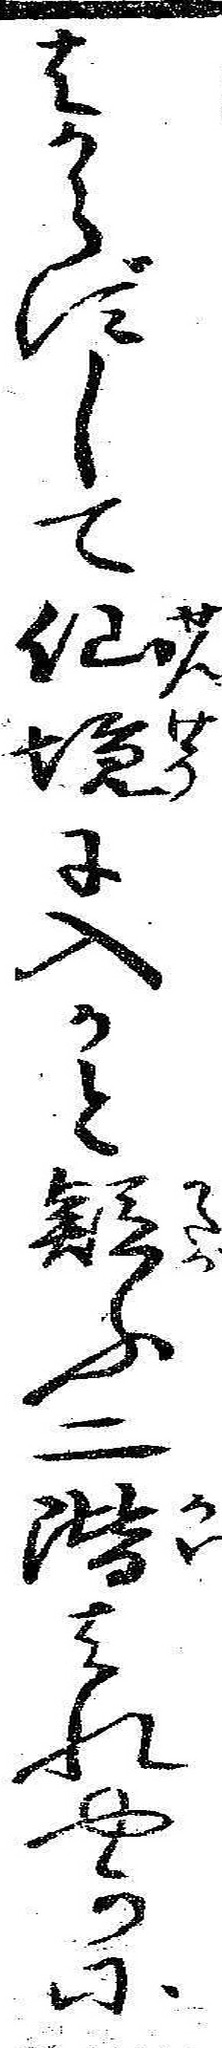はからずして仙境に入かと疑ふ二階はれやかに

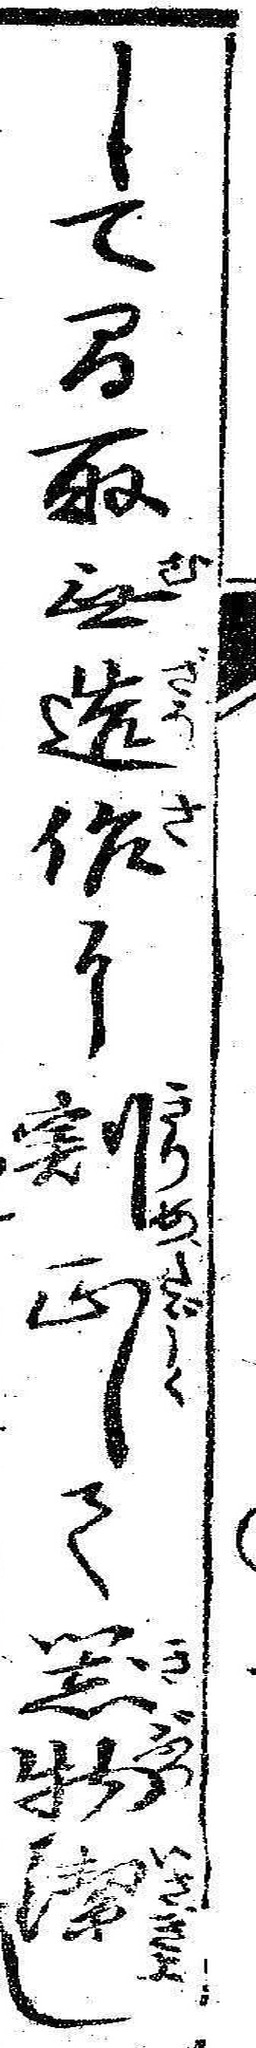して間取無造作に割正して器物潔し
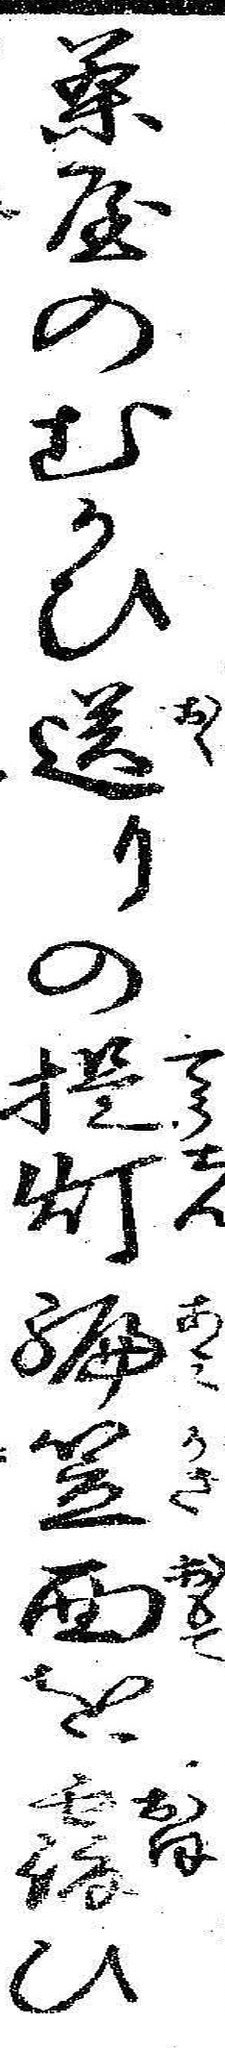茶屋のむかひ送りの提灯編笠面を覆ひ
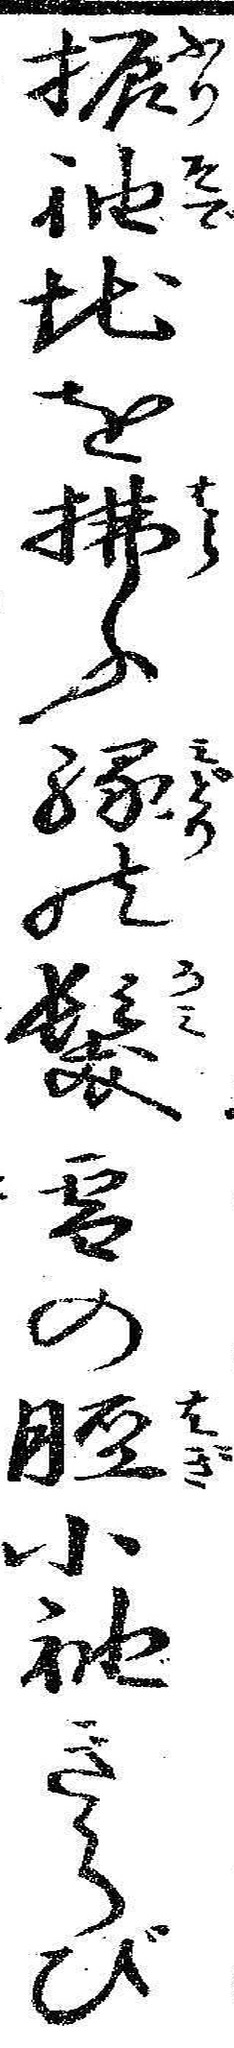振袖地を払ふ縁の髪雪の脛小袖きらび
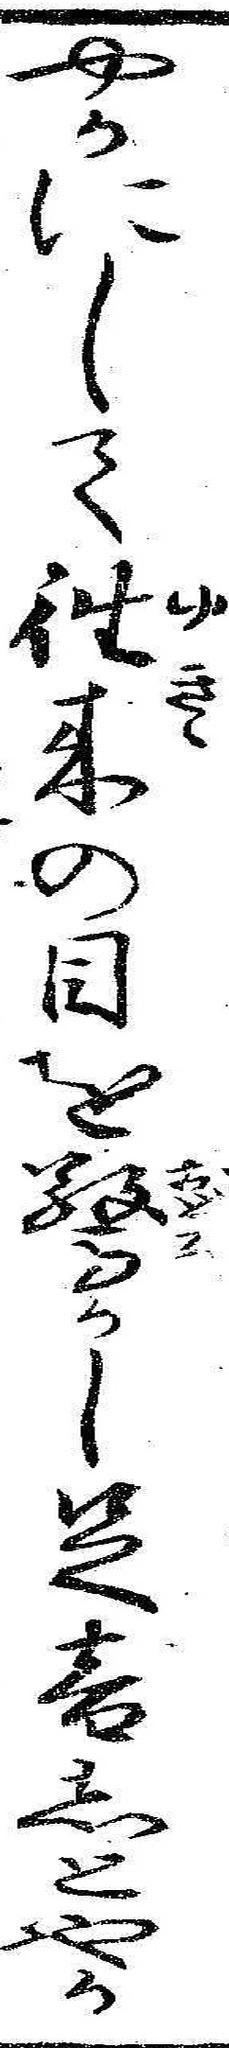やかにして往来の目を驚かし足音しとやか
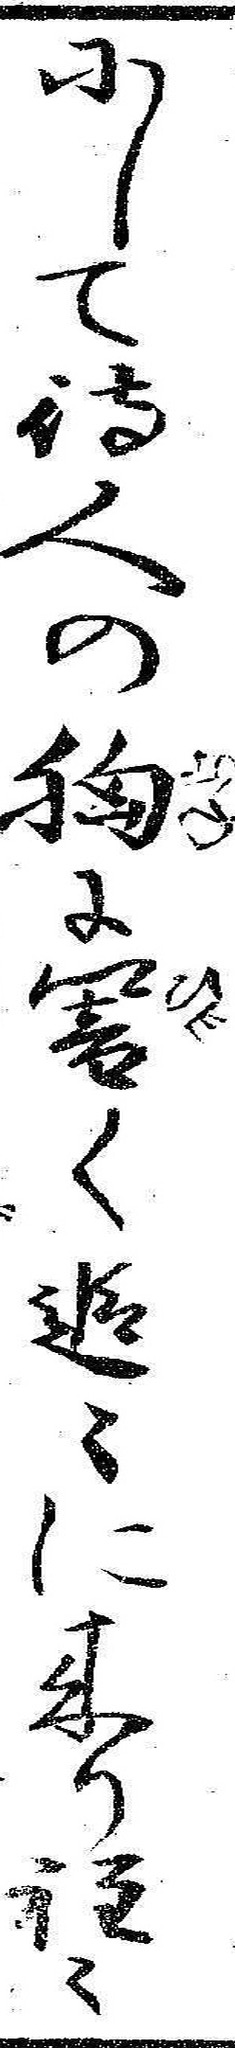にして待人の胸に響く追々に来り程々
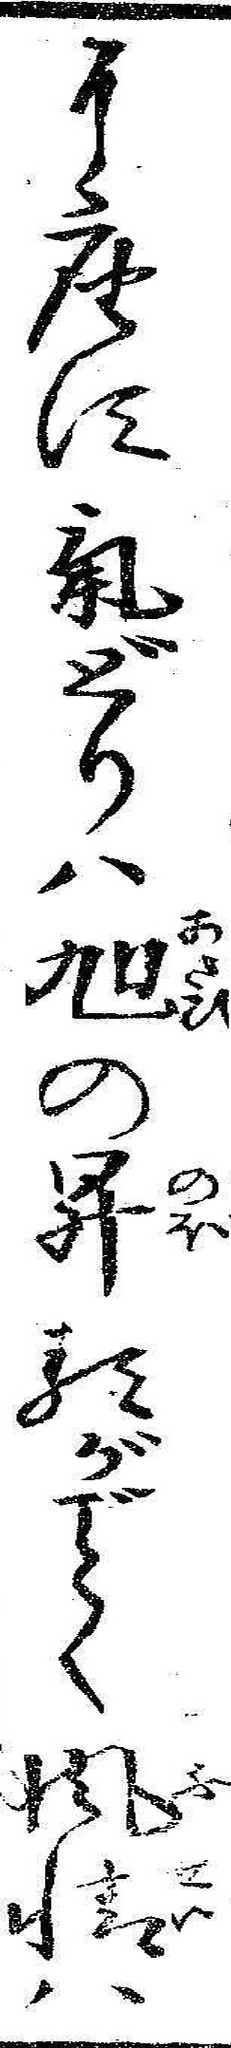に座す気どりは旭の昇るがごとく風情は
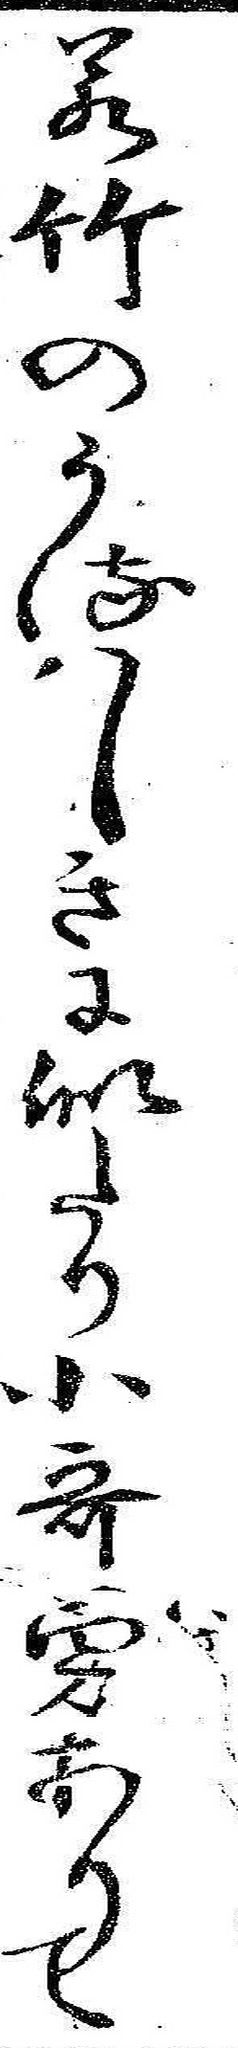若竹のうるはしきに似たり小哥勇ありて
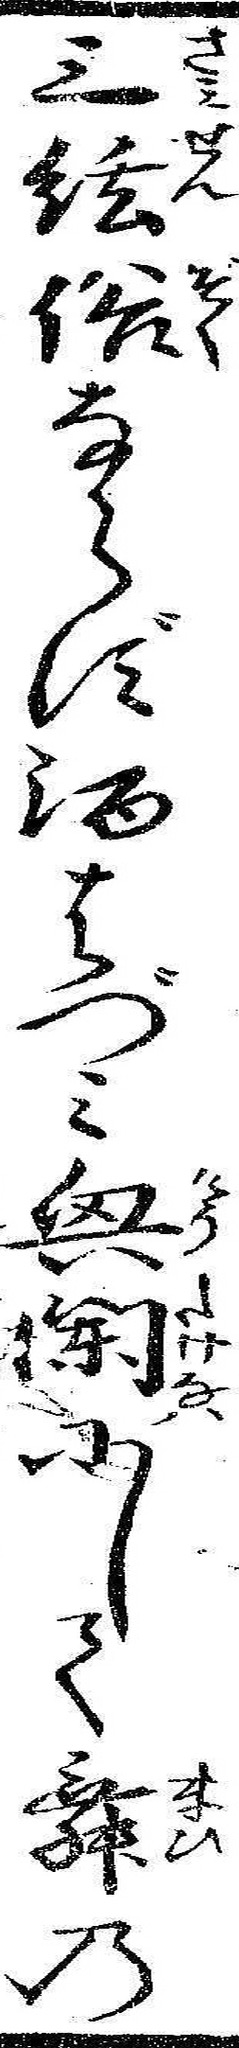三絃俗ならず酒はづみ興闌にして舞の
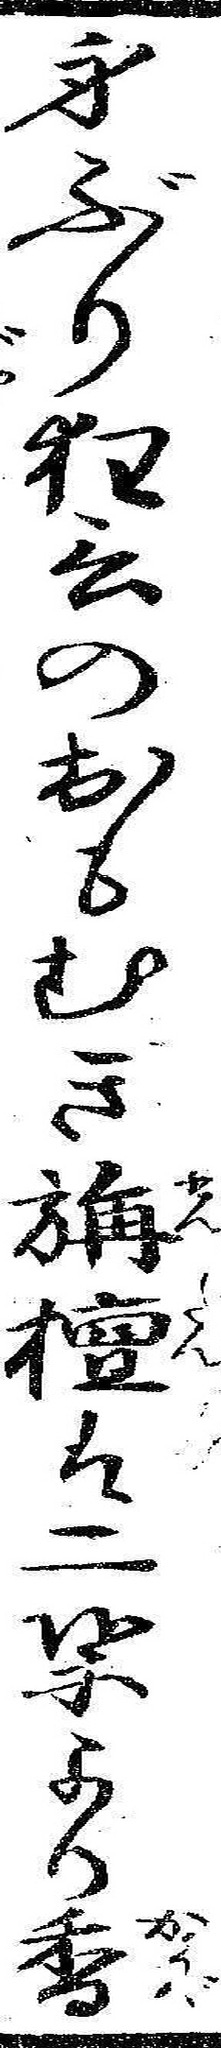身ぶり狂言のおもむき旃檀は二葉より香
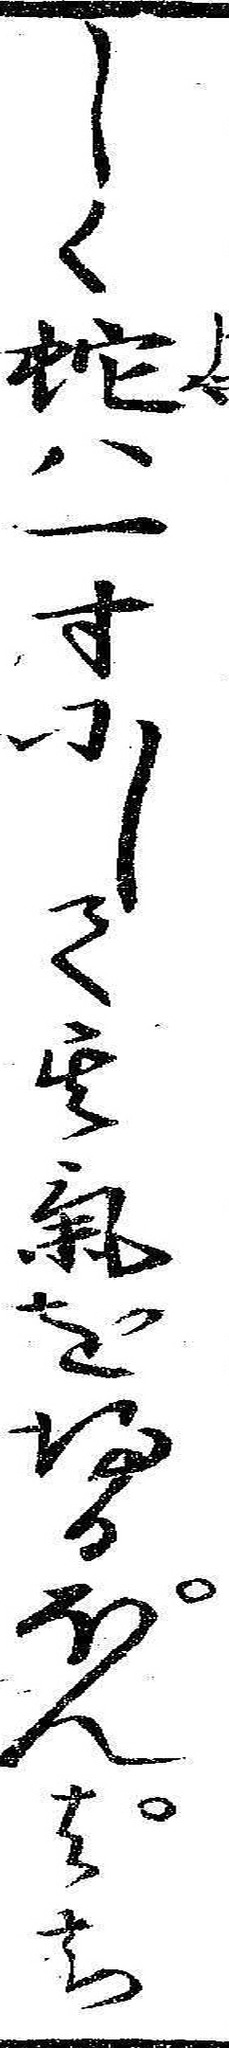しく蛇は一寸にして其気を得るぽんぱち
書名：根無草後編
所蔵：国文学研究資料館
